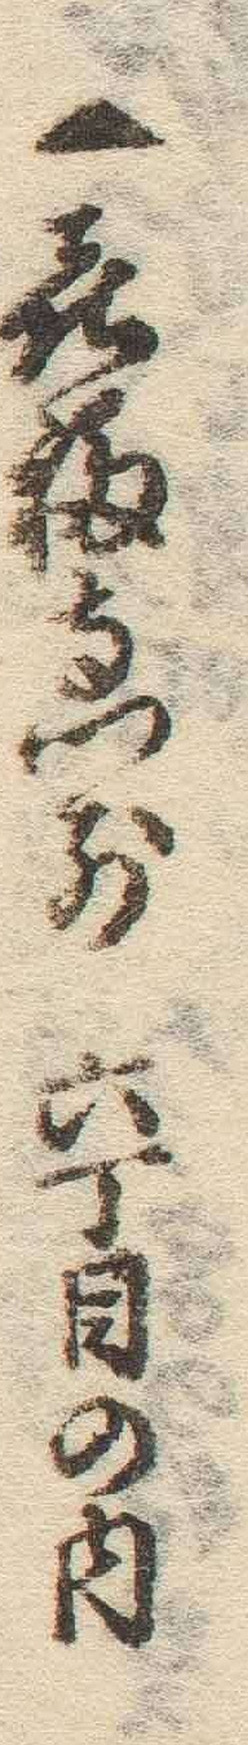▲喜福寺門前六丁目の内
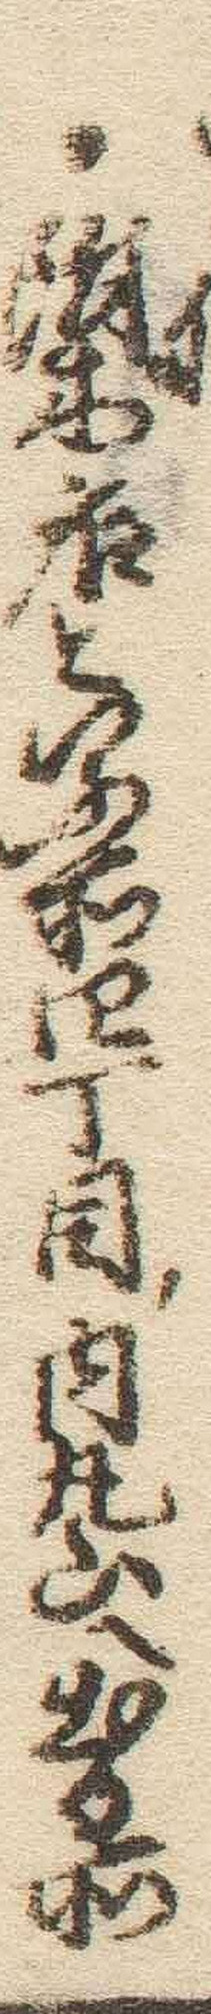・附木店といふ所四丁目ノ内丸山へ出る所
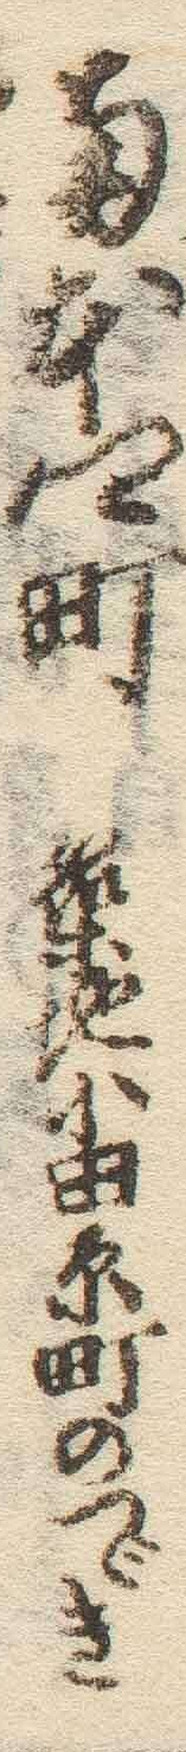南本郷町築地小田原町のつゞき
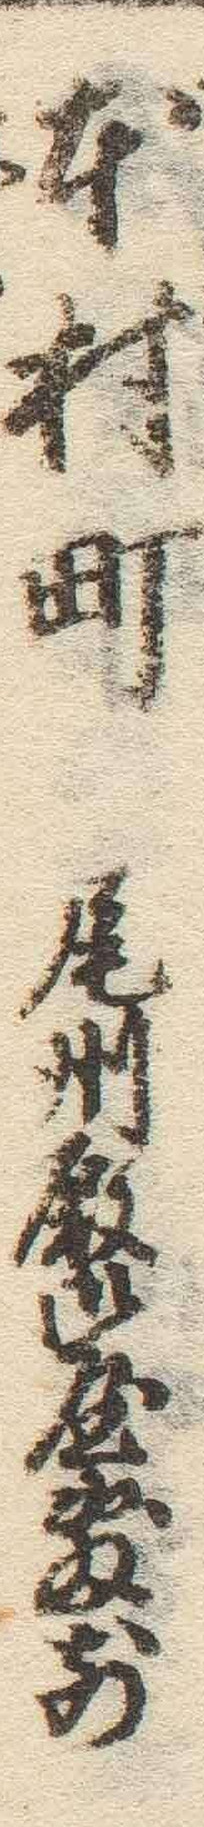本村町尾州殿御屋敷前
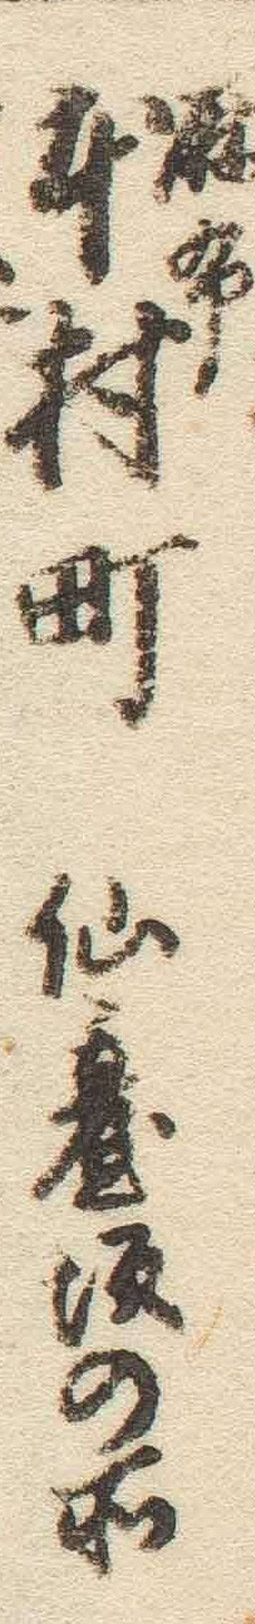本村町仙台坂の所
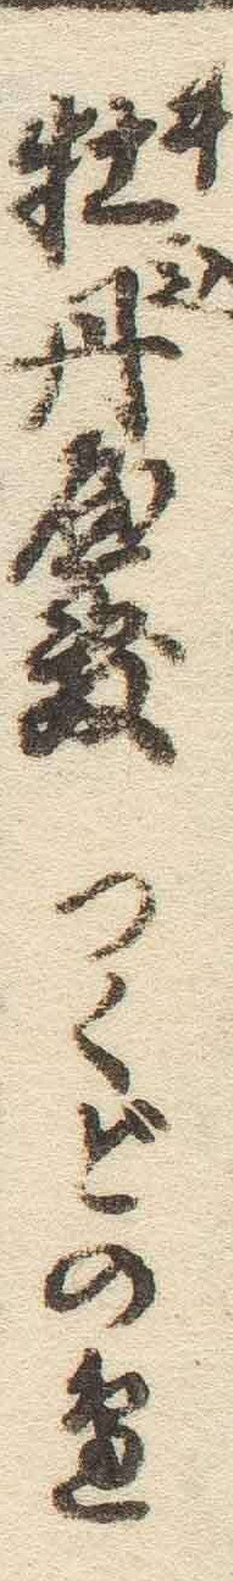牡丹屋敷つくどの辺
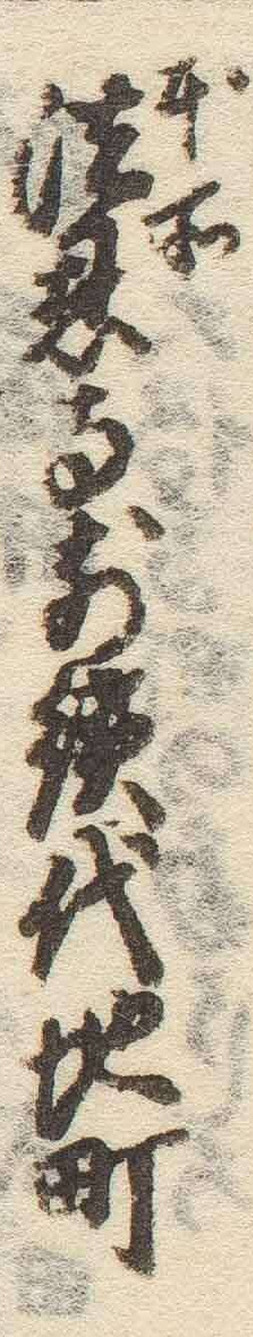法恩寺前続代地町
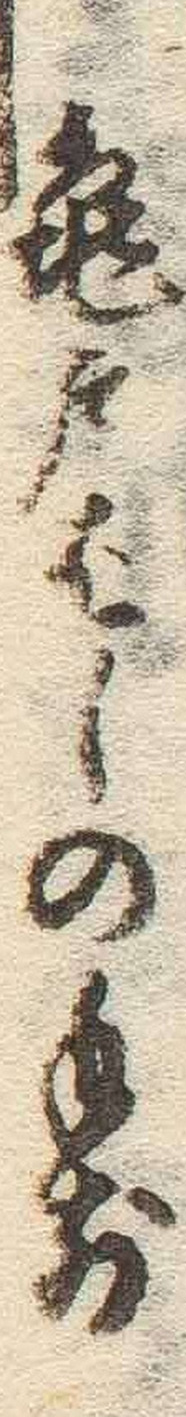亀戸ばしの手前
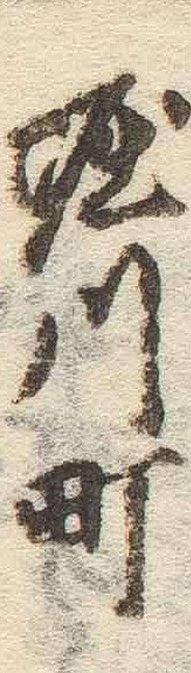堀川町
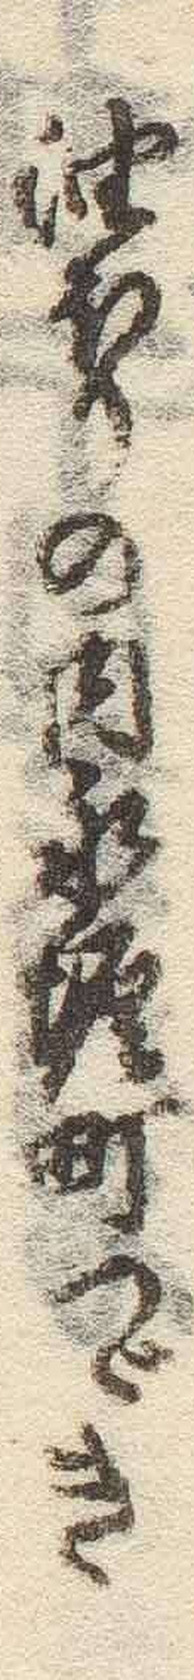油ほりの内永堀町つゞき
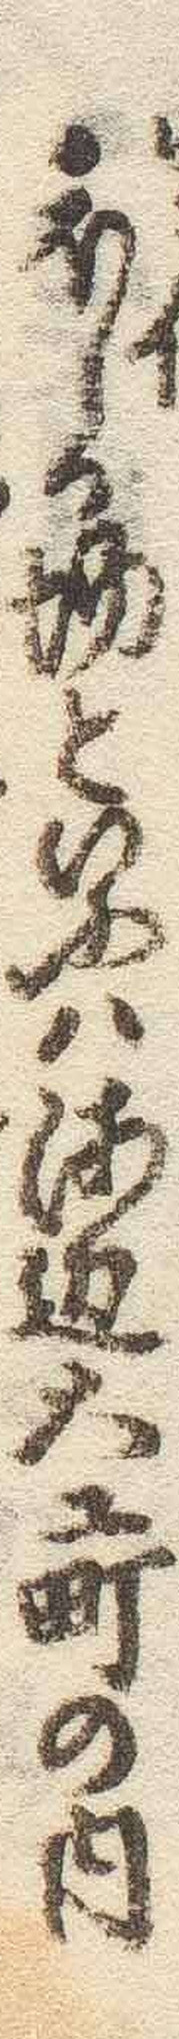・ほしか場といふは海辺大工町の内
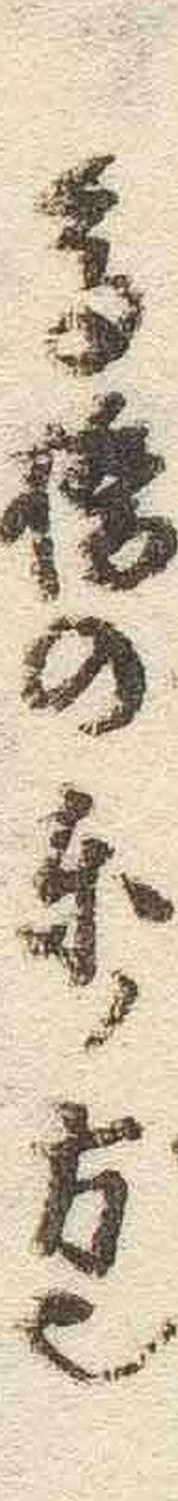高橋の東ノ方也
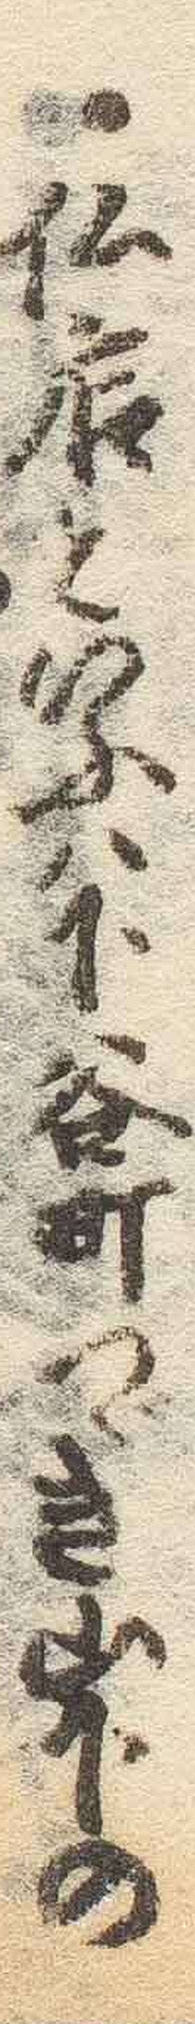・仏店といふは下谷町つゞき山下の
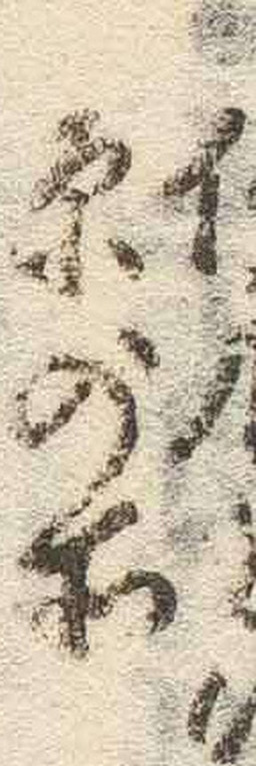原の所
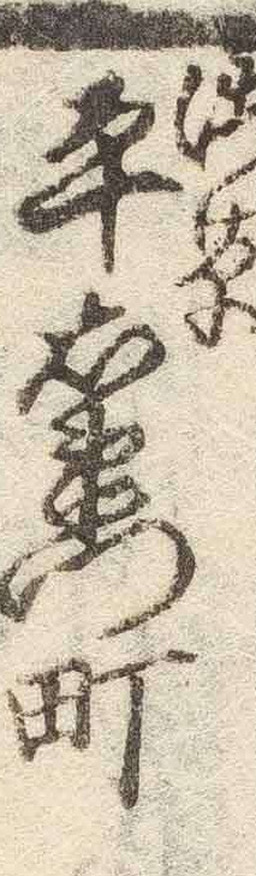平右衛門町
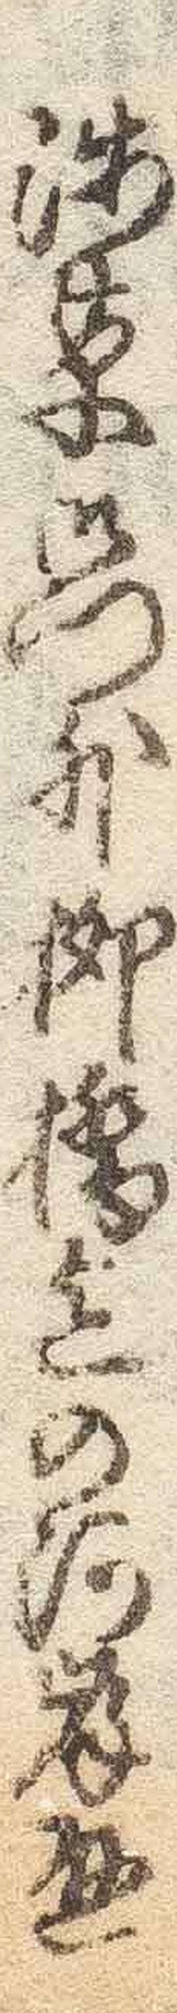浅草御門外柳橋迄の河岸通
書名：江戸町独案内
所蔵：東京学芸大学附属図書館 国文学研究資料館
